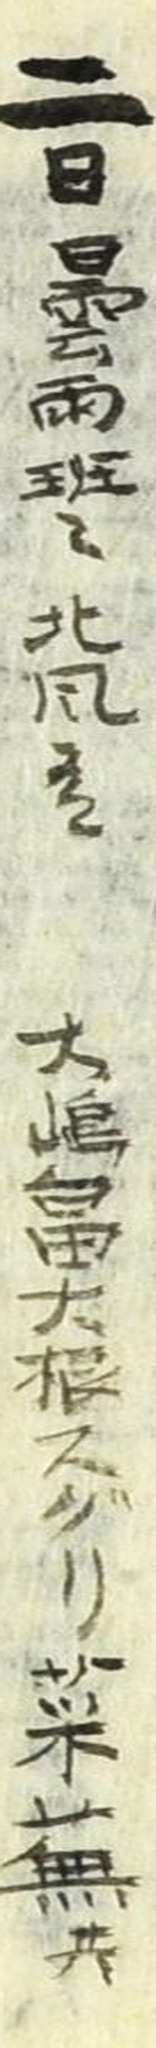二日曇雨班々北風有大島畠大根スグリ菜蕪共
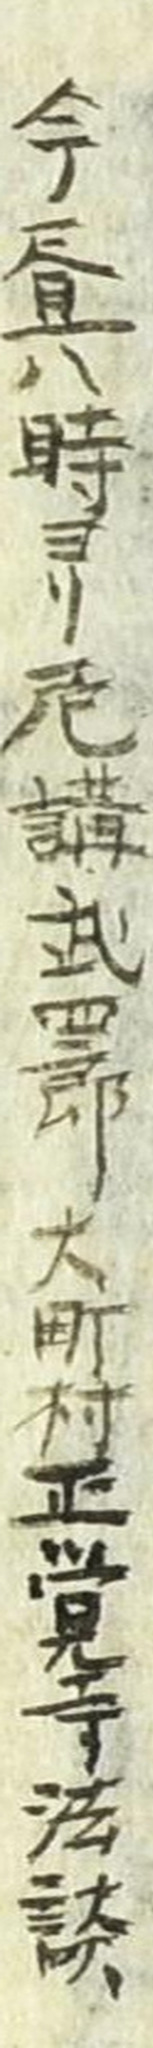今昼八時より尼講武四郎大町村正覚寺法談
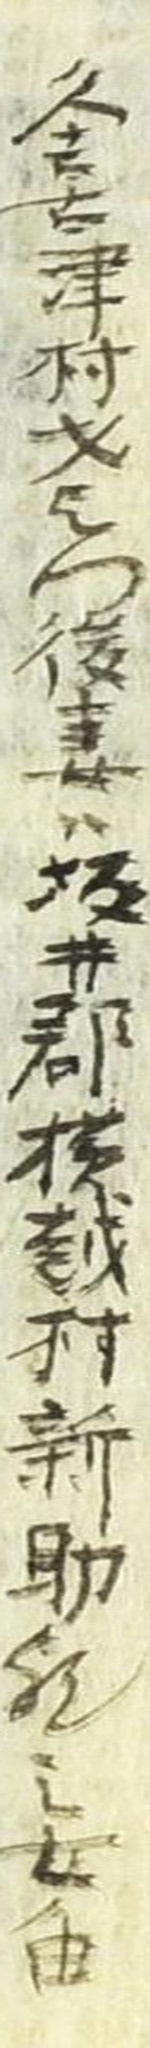久喜津村才与衛門後妻ハ坂井郡横越村新助歟之女ノ由
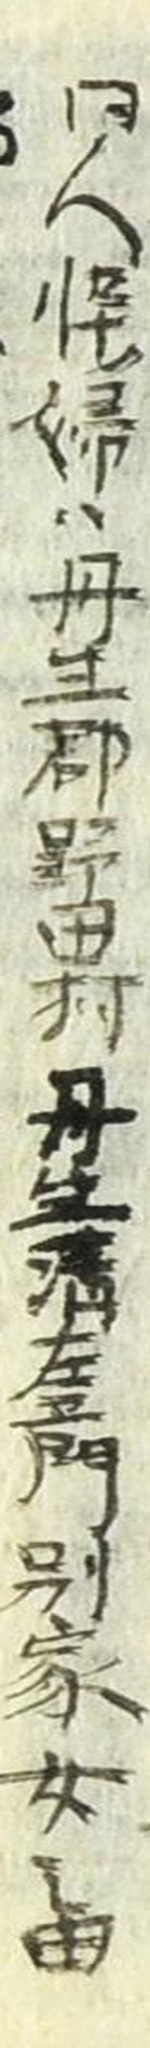同人倅婦ハ丹生郡野田村丹生清左衛門別家女之由
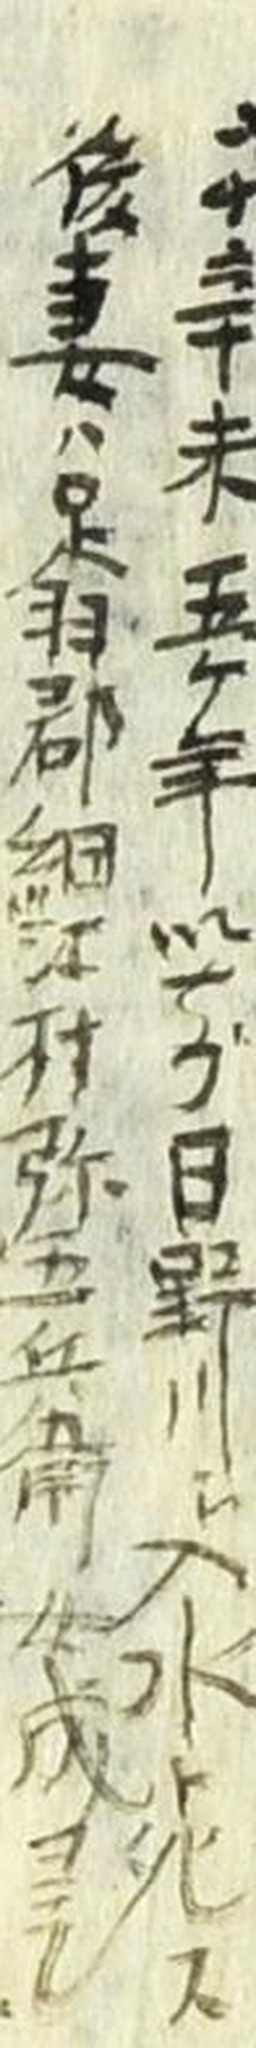後妻ハ足羽郡細江村弥五兵衛女成ヨシ
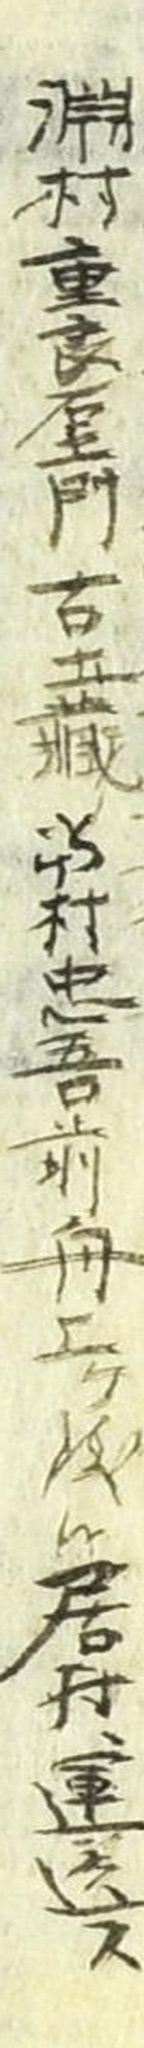淵村重良右ヱ門古土蔵当村忠吾前舟上ケ致候居村へ運送ス
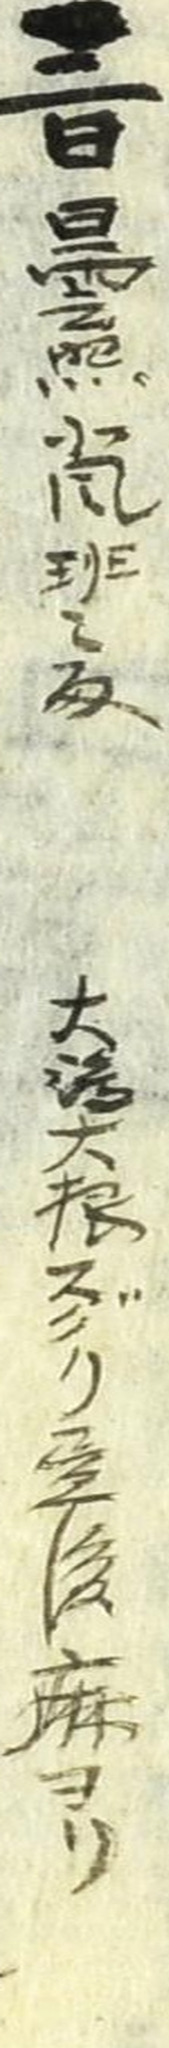三日曇照北風班々雨大島大根スグリ昼後麻ヨリ
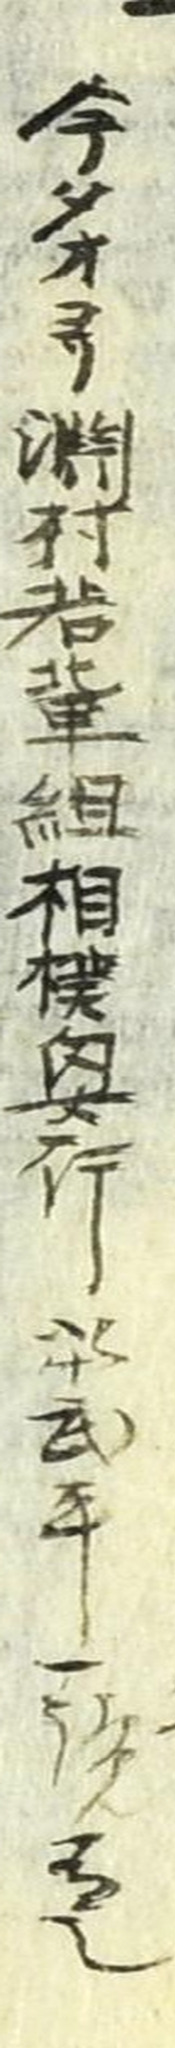今夕方ヨリ淵村若輩組相撲興行当武平一覧有之
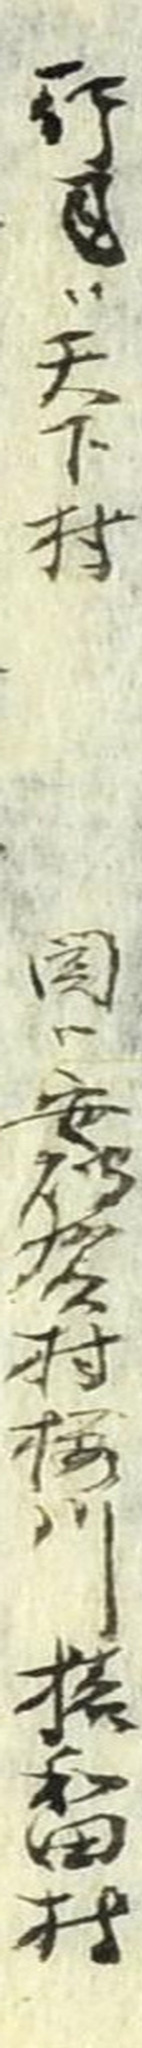行司ハ天下村関ハ安破賀村桜川猿和田村
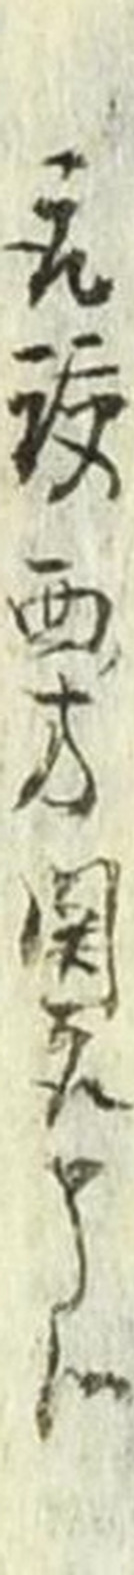取跤西ノ方関取申候
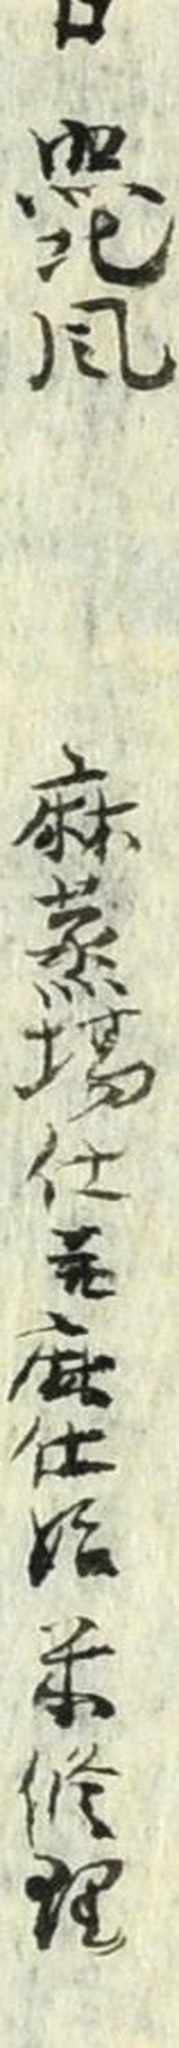四日照北風麻蒸場仕幷麻仕始米修理
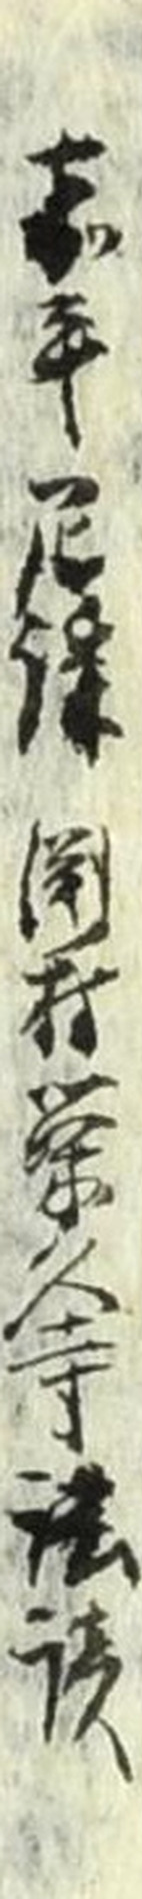嘉平尼講淵村栄久寺法談
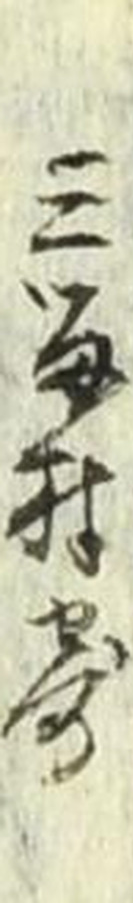三留村寄
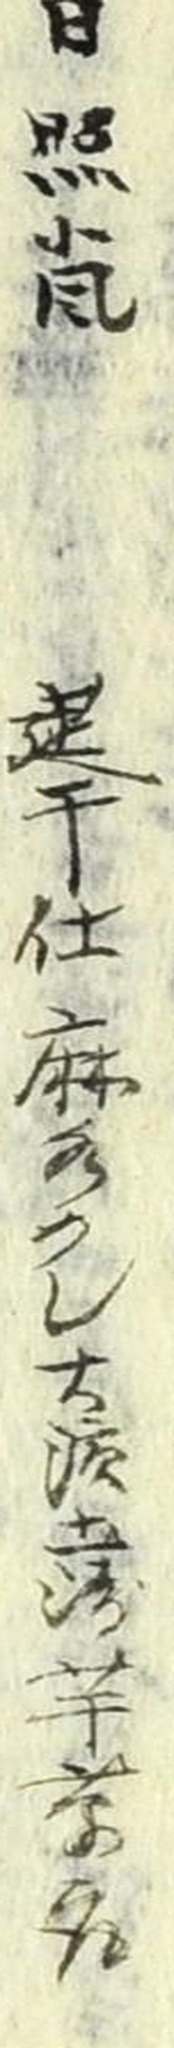五日照北風莚干仕麻水クレ大浜土崎芋草取
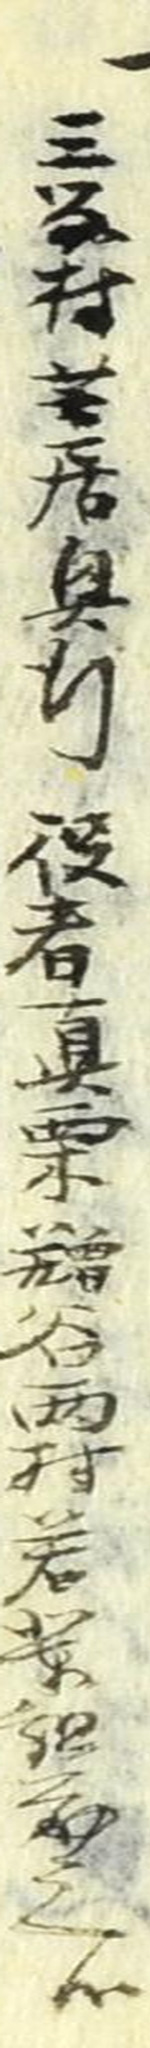三留村芝居興行役者真栗甑谷両村若輩組勤之候
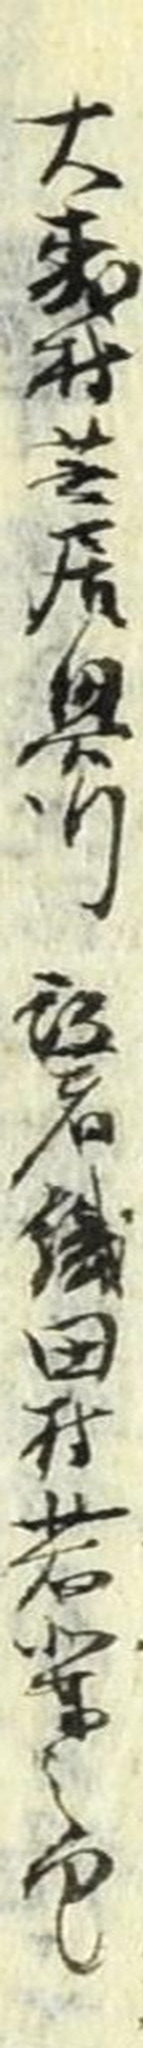大森村芝居興行役者織田村若輩之由
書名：（日記）
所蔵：福井県文書館 Fukui Prefectural Archives
